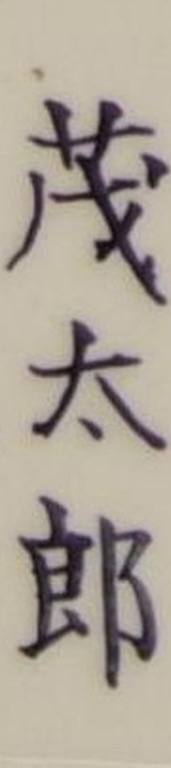茂太郎

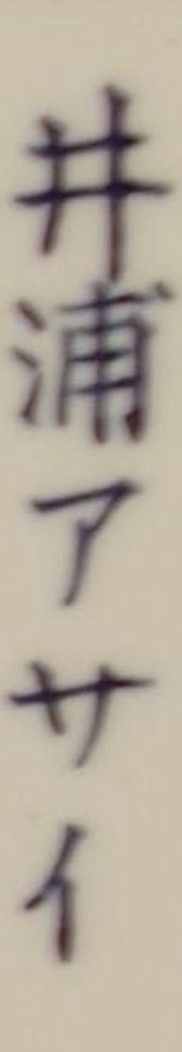井浦アサイ
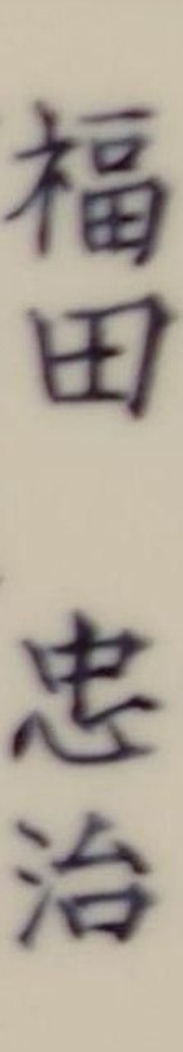福田忠治
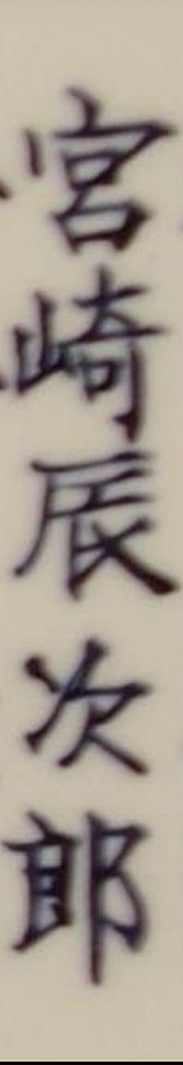宮崎辰次郎
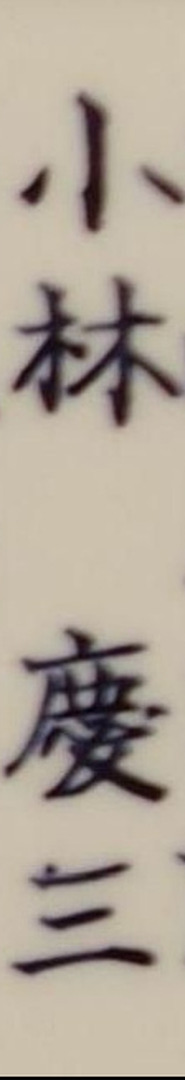小林慶三
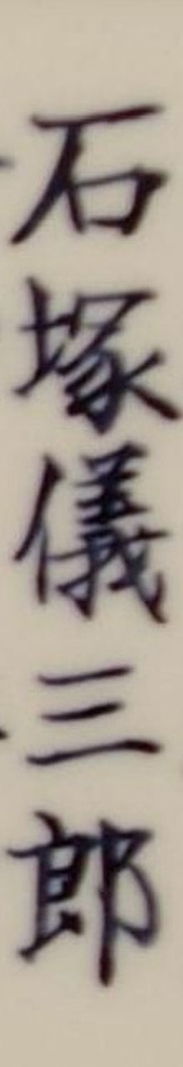石塚儀三郎
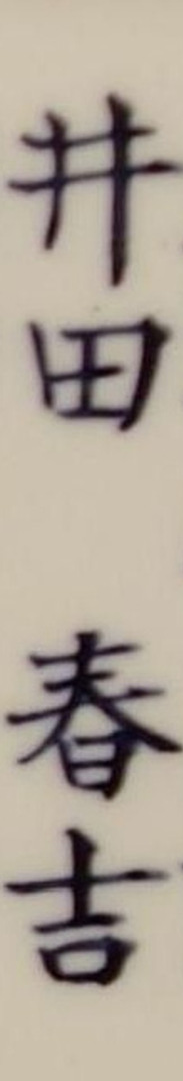井田春吉
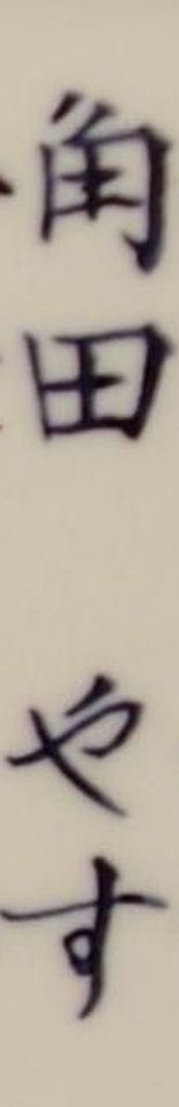角田やす
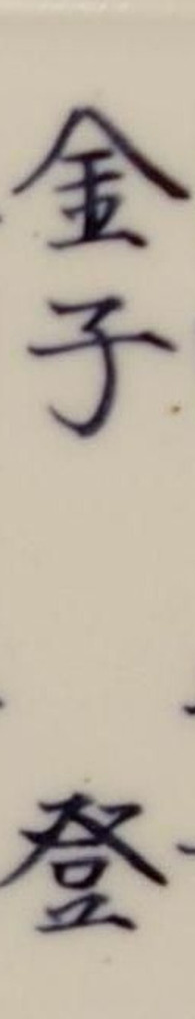金子登
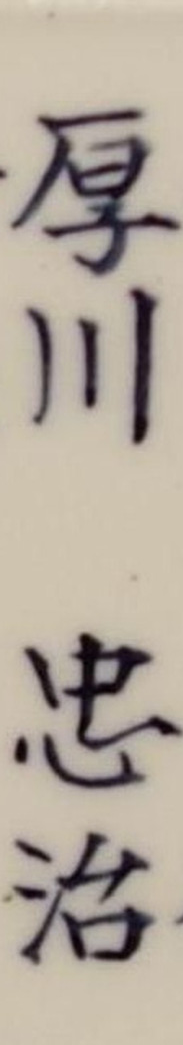厚川忠治
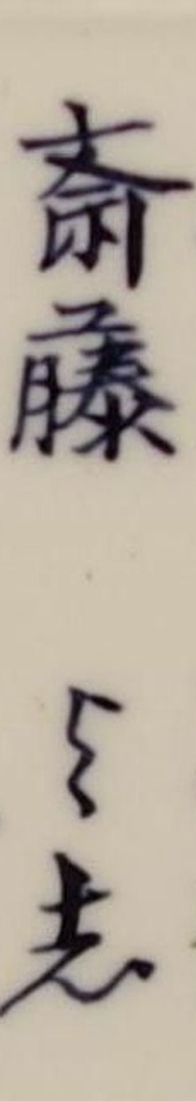斉藤よし
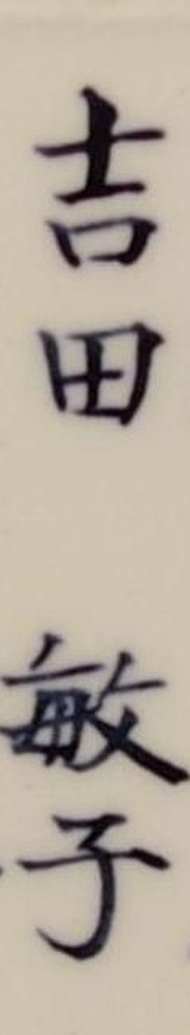吉田敏子
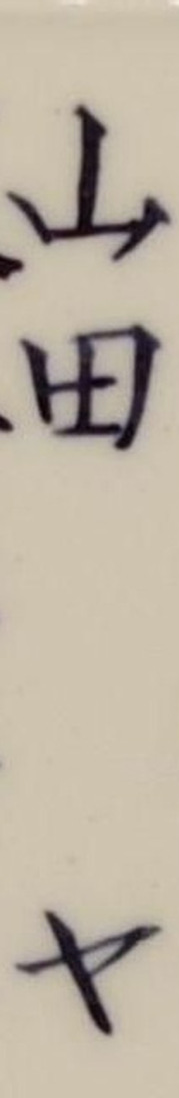山田ヤ
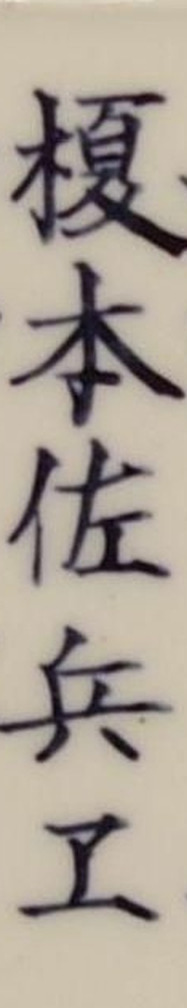榎本佐兵ヱ
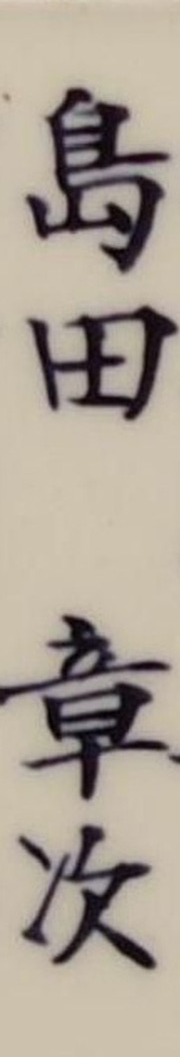島田章次
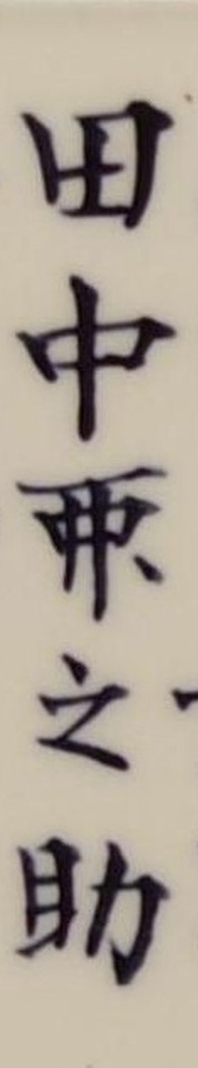田中柳之助
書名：M~S
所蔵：高野山金剛峯寺
